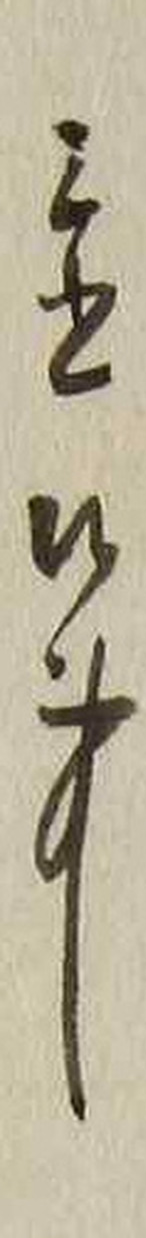置候事
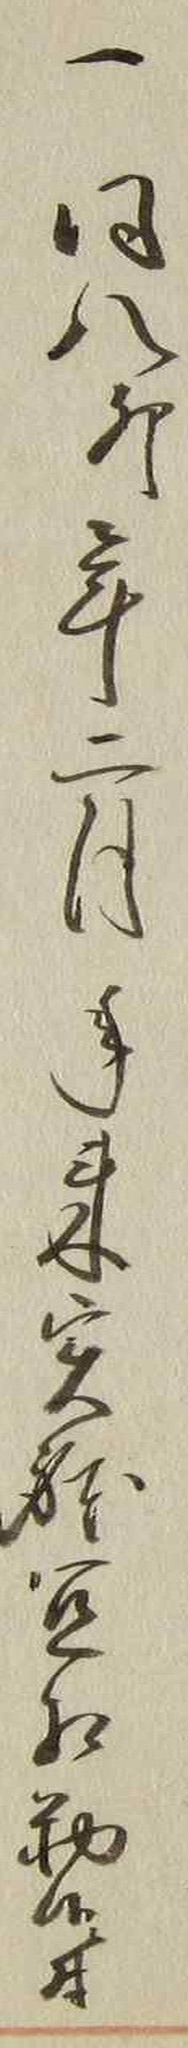一同八卯年二月年来実体宜相勤候ニ付
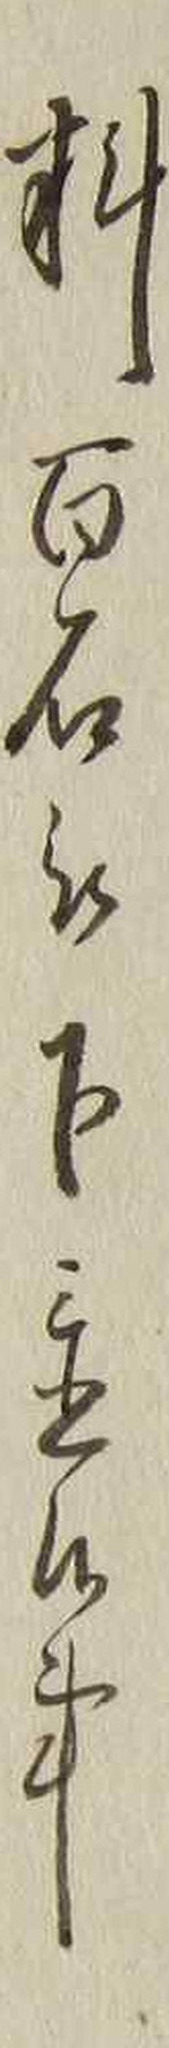料百石被下置候事
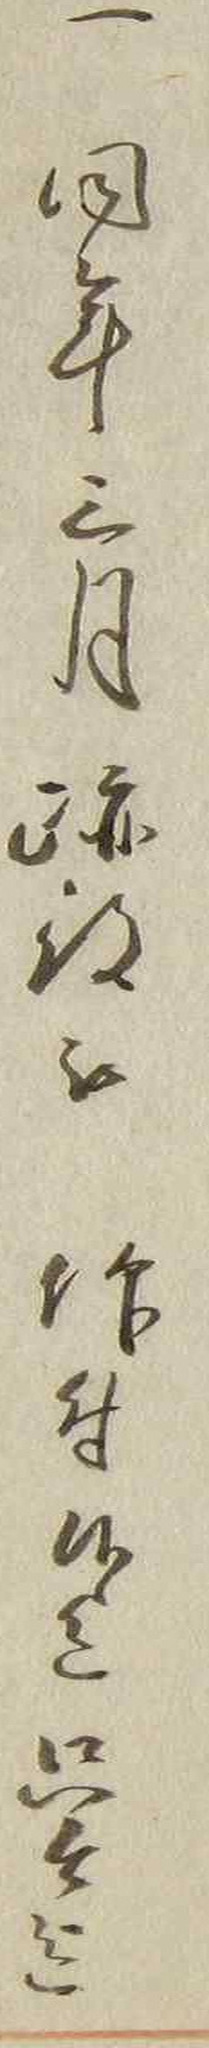一同年三月跡役被仰付候迄只今迄
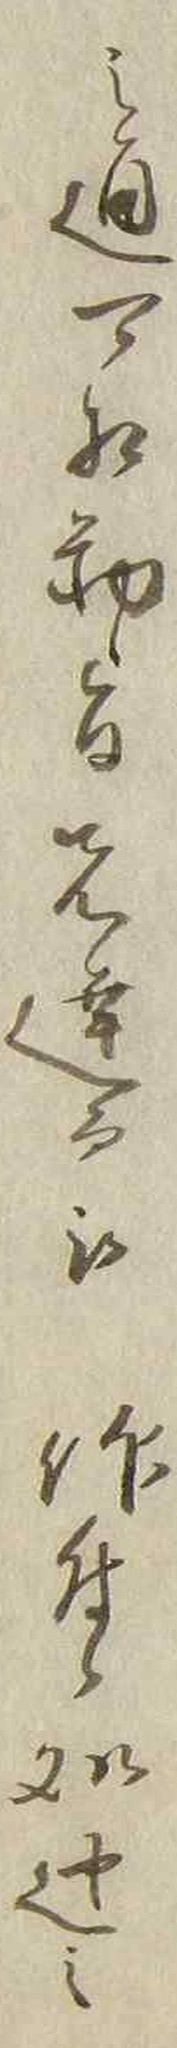之通可相勤旨先達而被仰付候処迚之

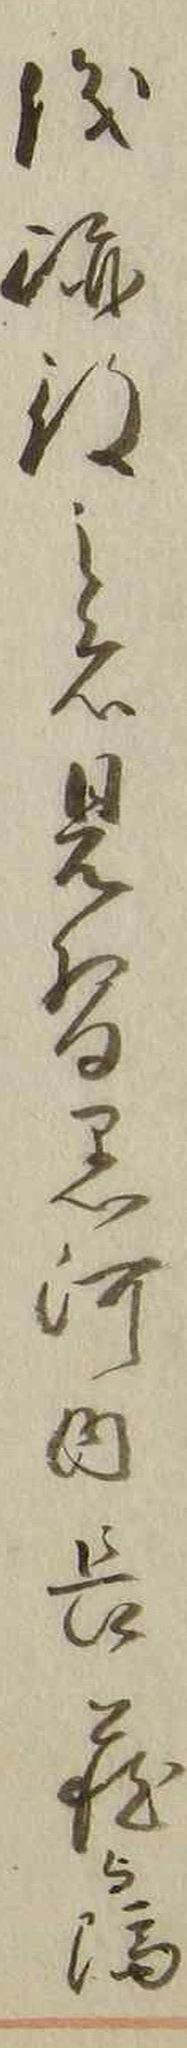儀跡役之者見習黒河内長蔵与隔
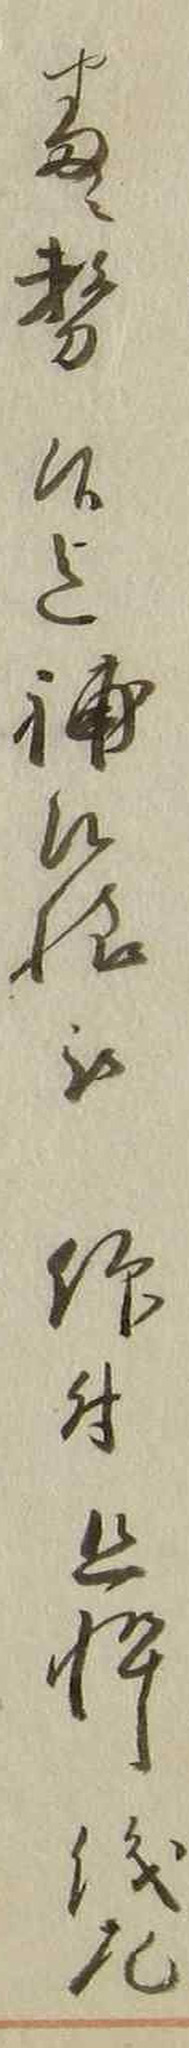番ニ務候迄補候様被仰付且忰儀左
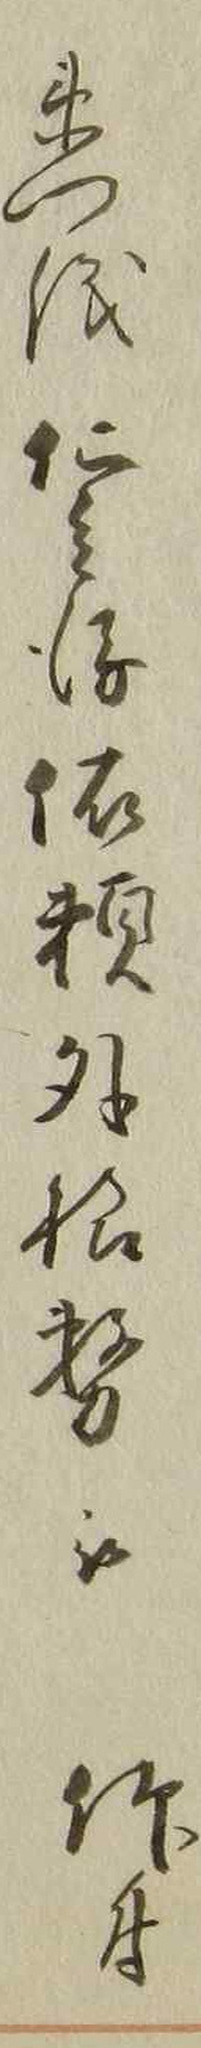衛門儀仁兵衛依頼外様務被仰付
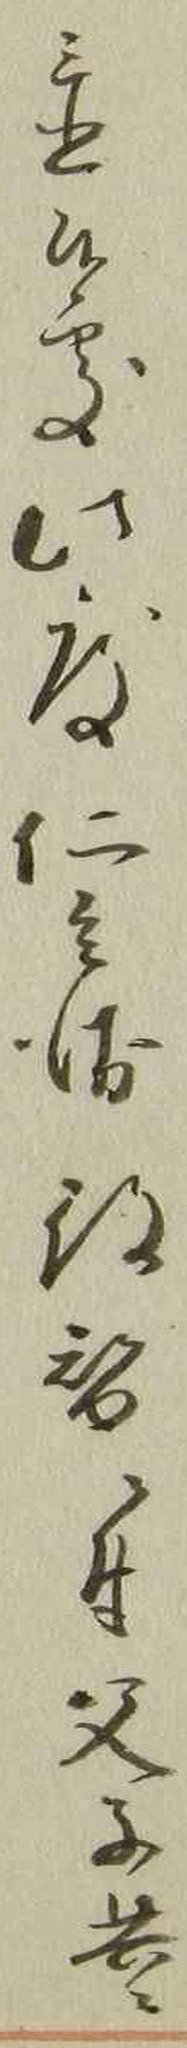置候処此度仁兵衛役替ニ付父子共ニ
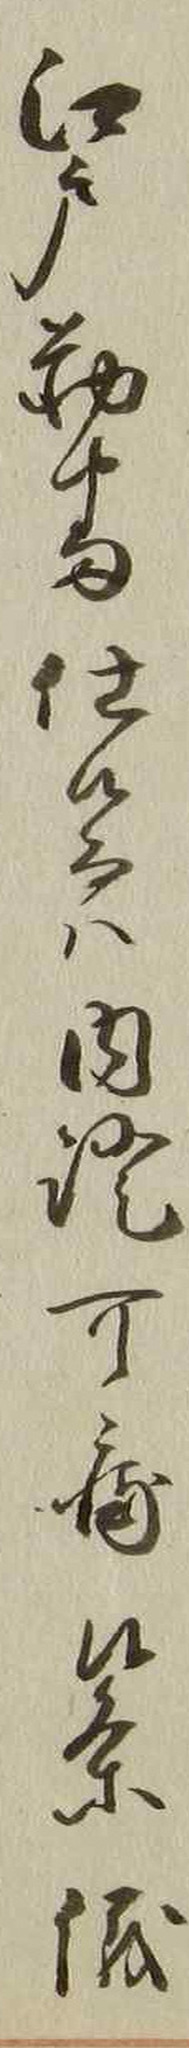江戸勤番仕候而ハ内証可為候条儀
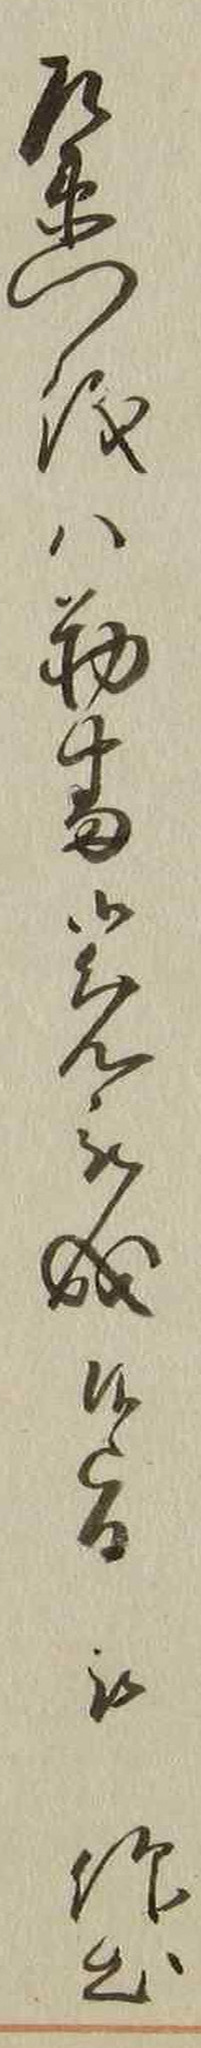左衛門儀ハ勤番御免被成候旨被仰出
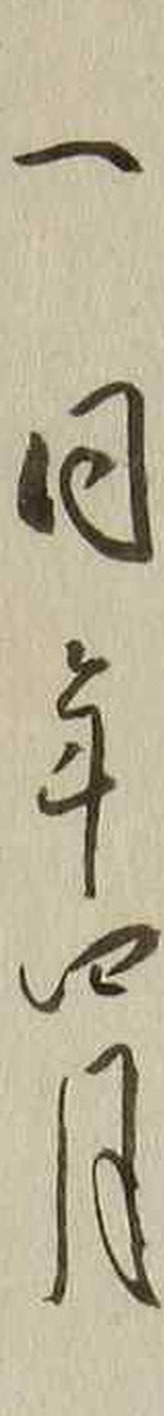一同年四月
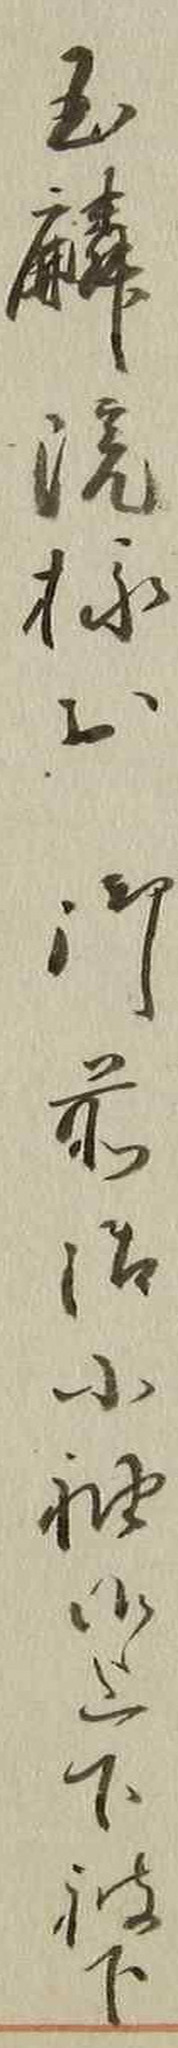玉麟院様於御前御小袖御上下被下
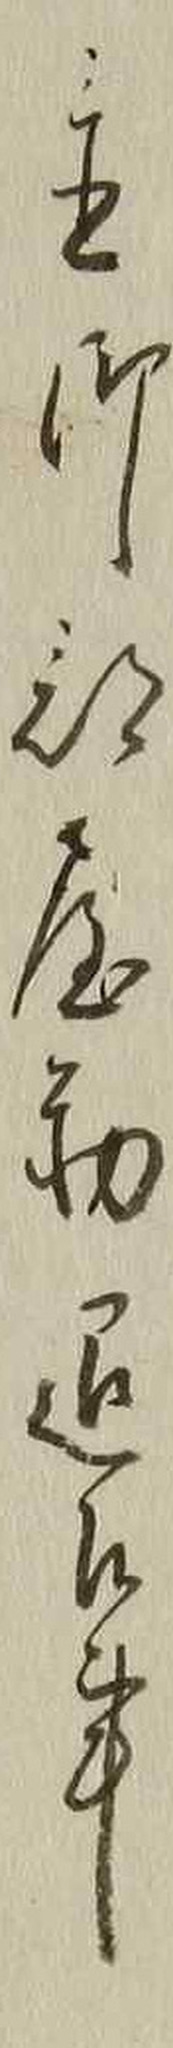置御部屋勤退候事
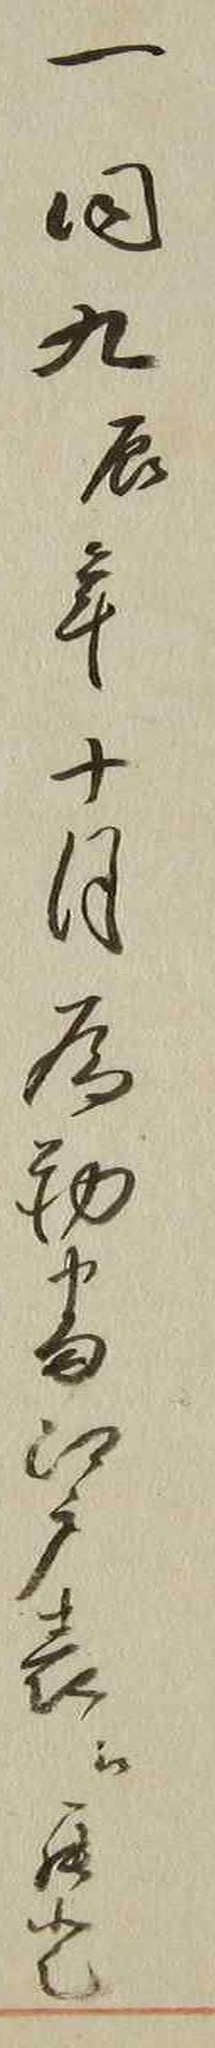一同九辰年十月為勤番江戸表江罷登
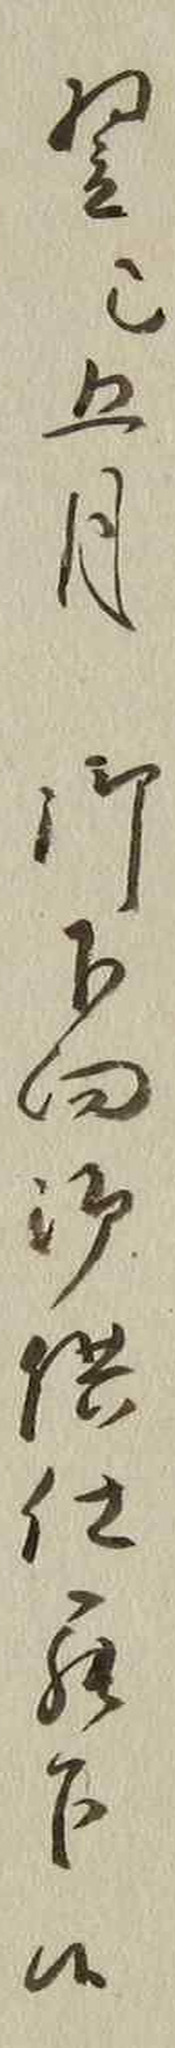翌巳五月御下向御供仕罷下候
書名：諸士系譜　巻之122　よ之部5
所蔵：会津若松市立会津図書館
